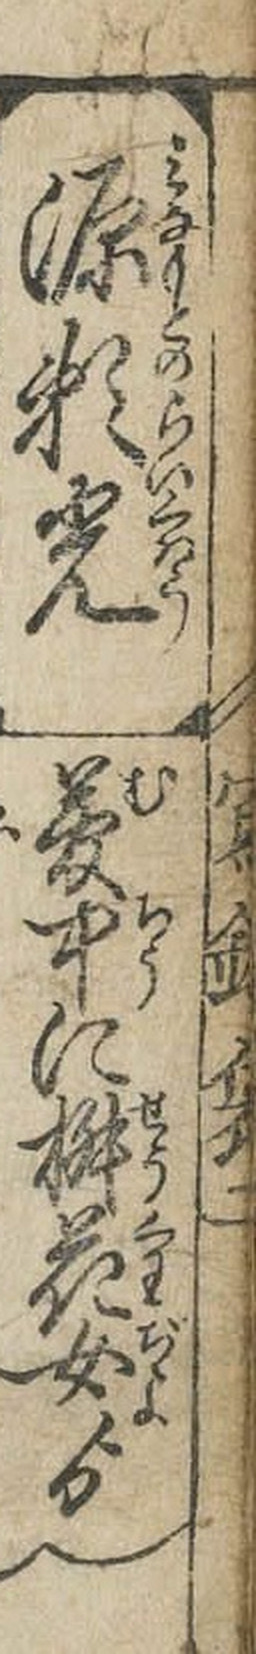源頼光夢中に抍花女より
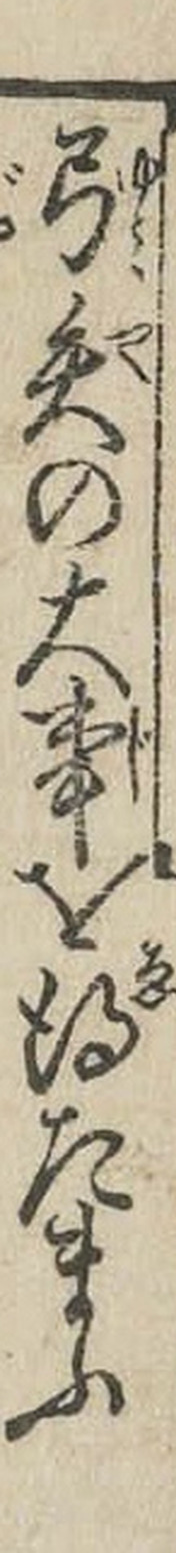弓矢の大事を得たまふ
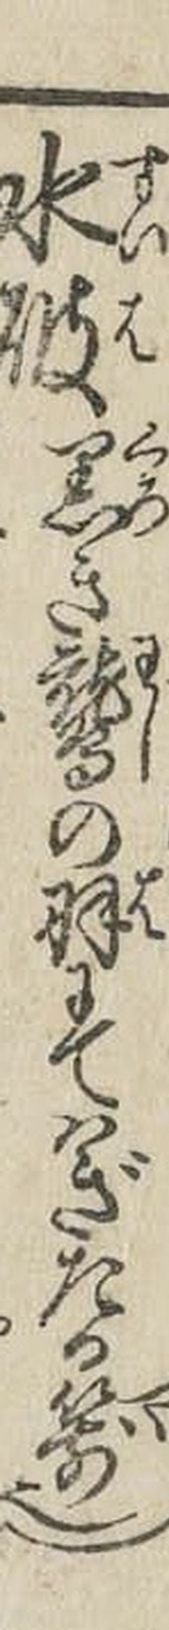水破黒き鷲の羽にてはぎたる箭也
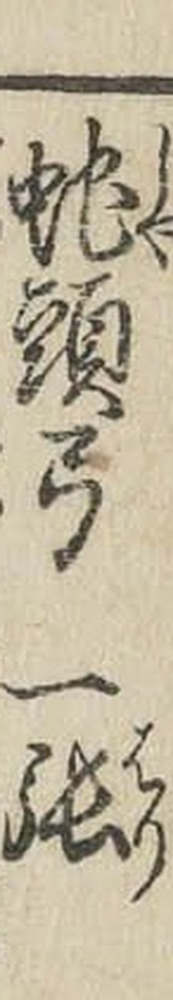蛇頭弓一張
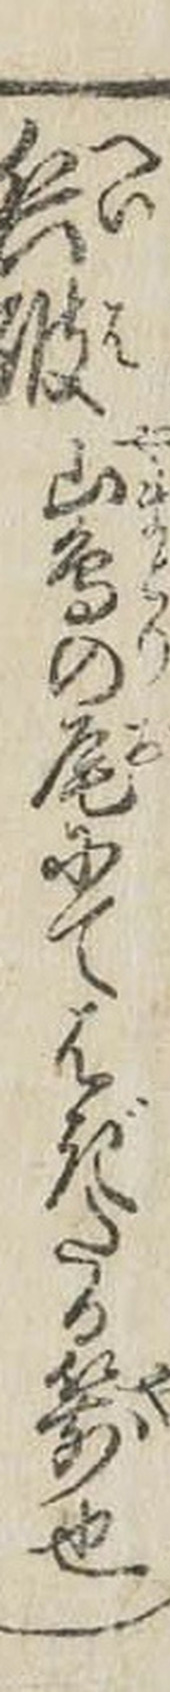兵破山鳥の尾にてはぎたる箭也
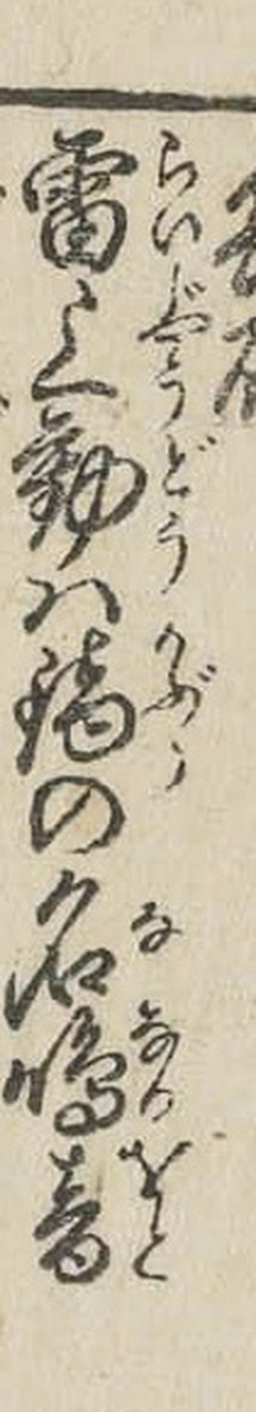雷上動は鏑の名鳴音
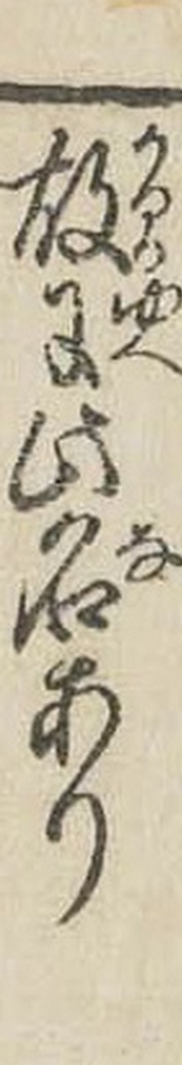故に名あり
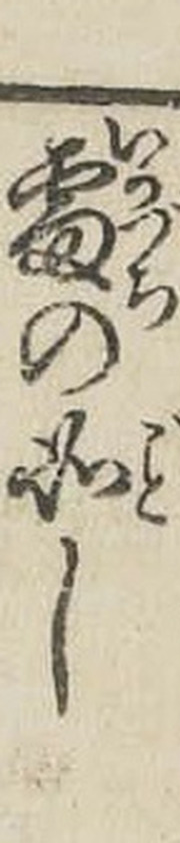雷の如し
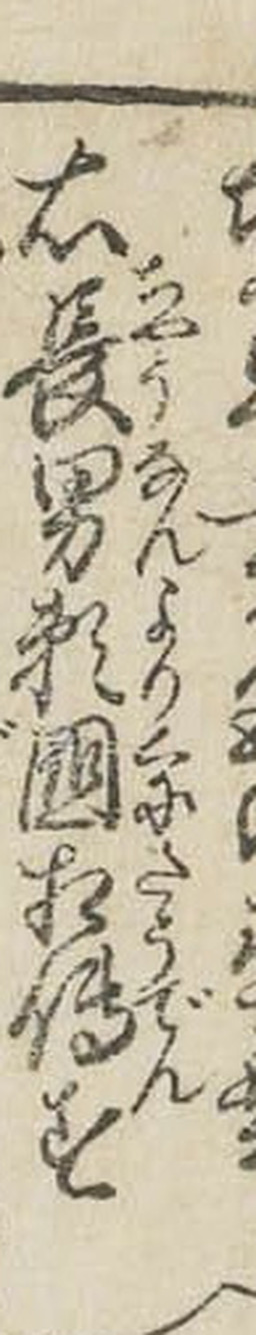右長男頼国相伝す
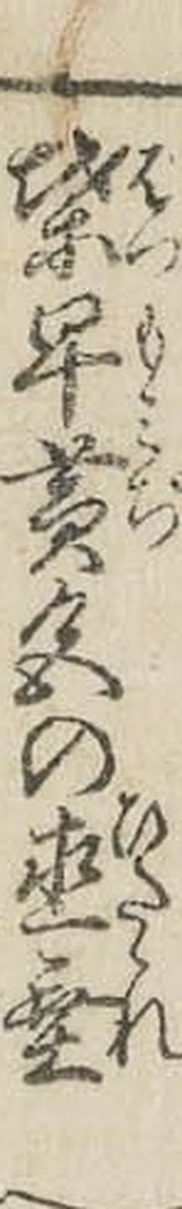葉早黄色の直垂
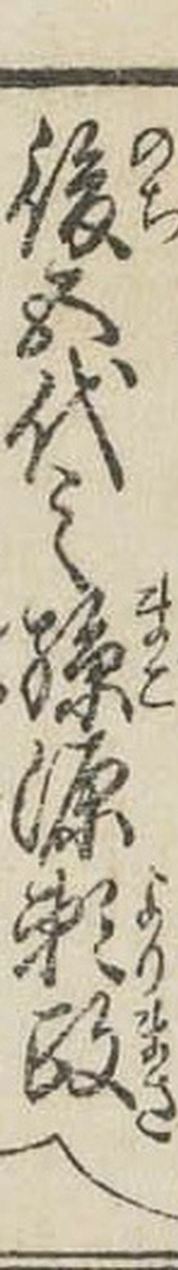後五代之孫源頼政
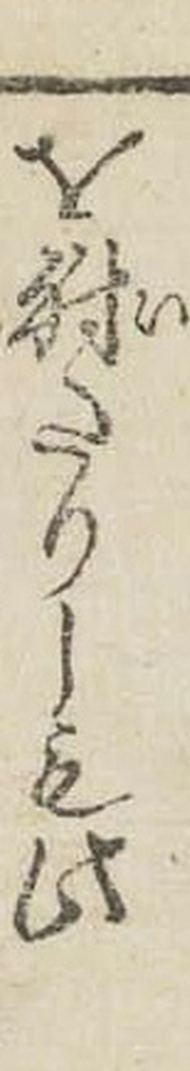を射たりしも此
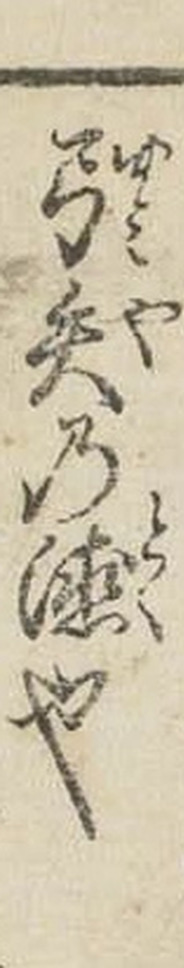弓矢の徳也
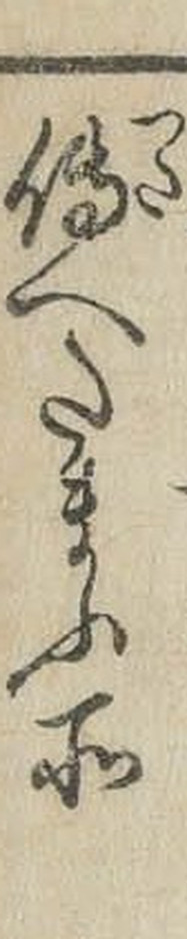伝へたまふ所

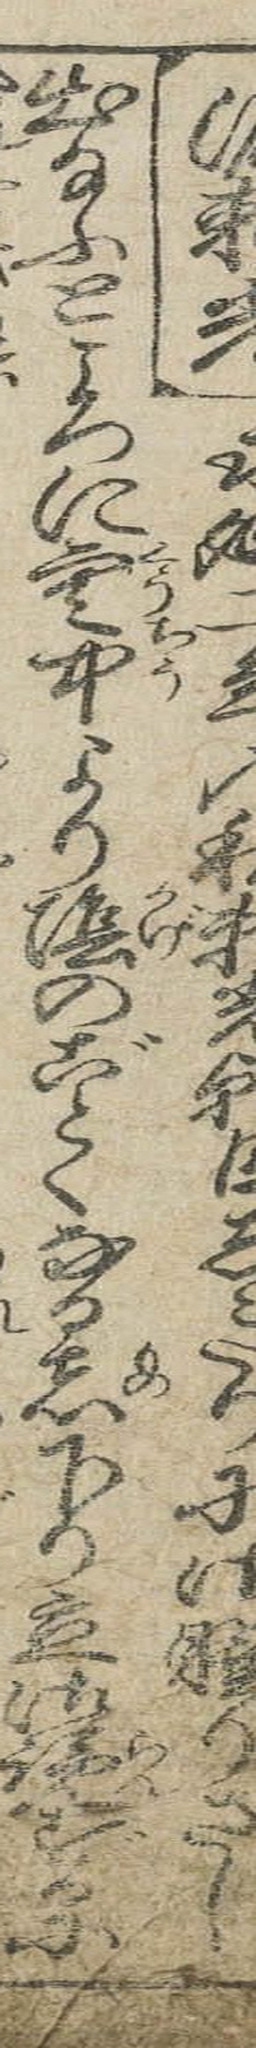出給ふところに空中より蔭のごとくなる者下り立御覧ずるに
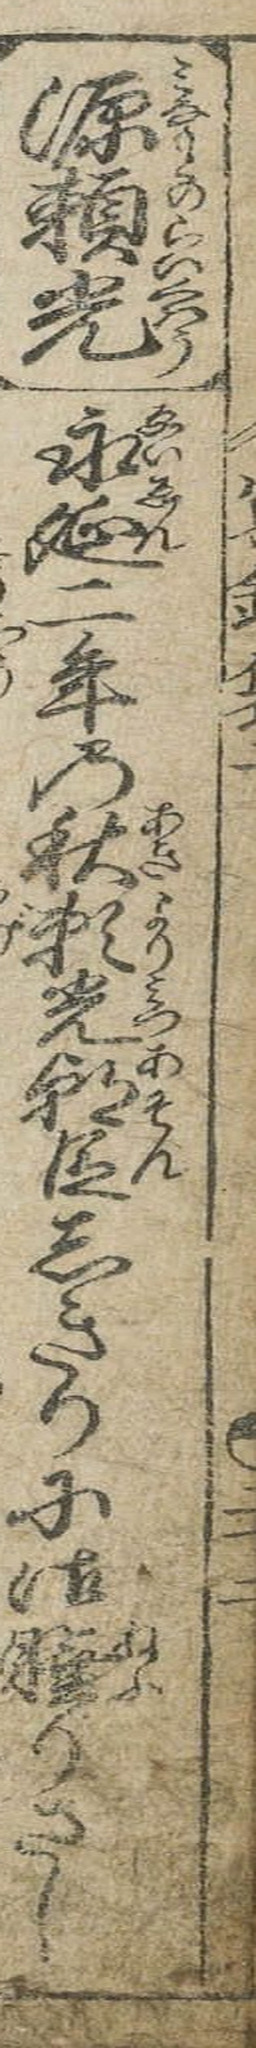源頼光永延二年の秋頼光朝臣しきりに御睡りさし
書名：絵本写宝袋 9巻 2之巻
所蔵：東京学芸大学教育コンテンツアーカイブ
